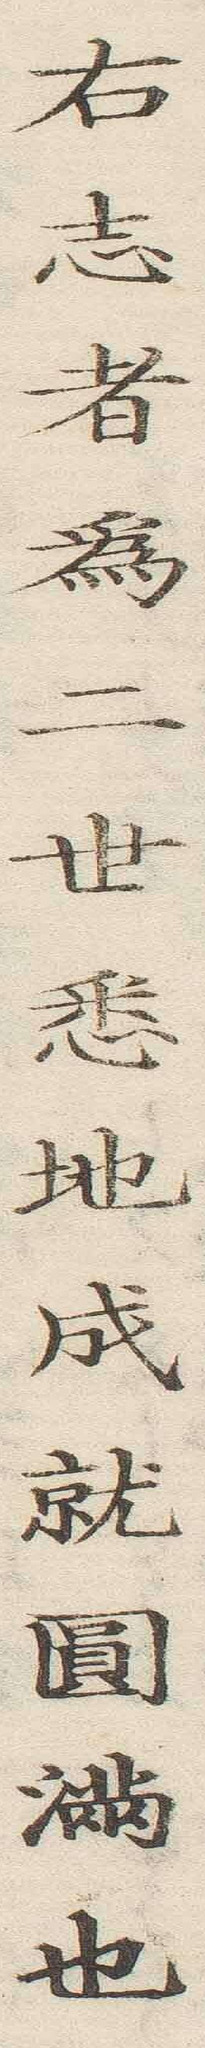右志者爲二世悉地成就圓滿也
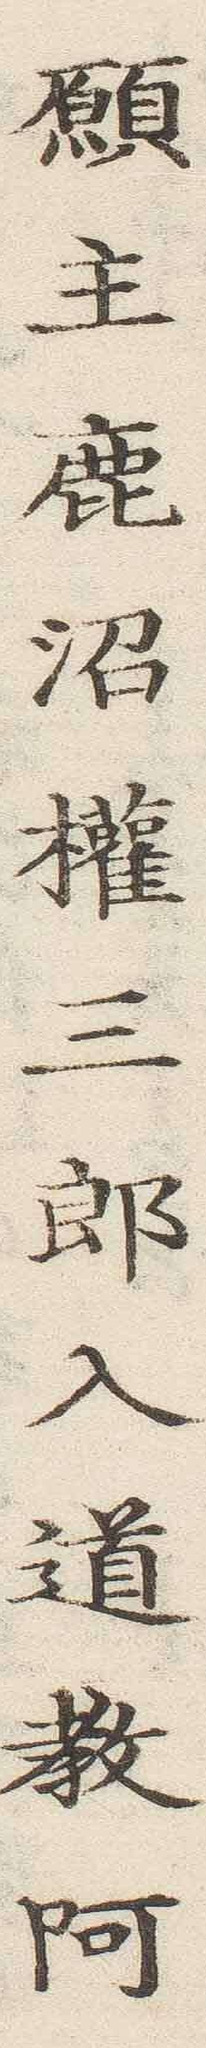願主鹿沼權三郞入道教阿
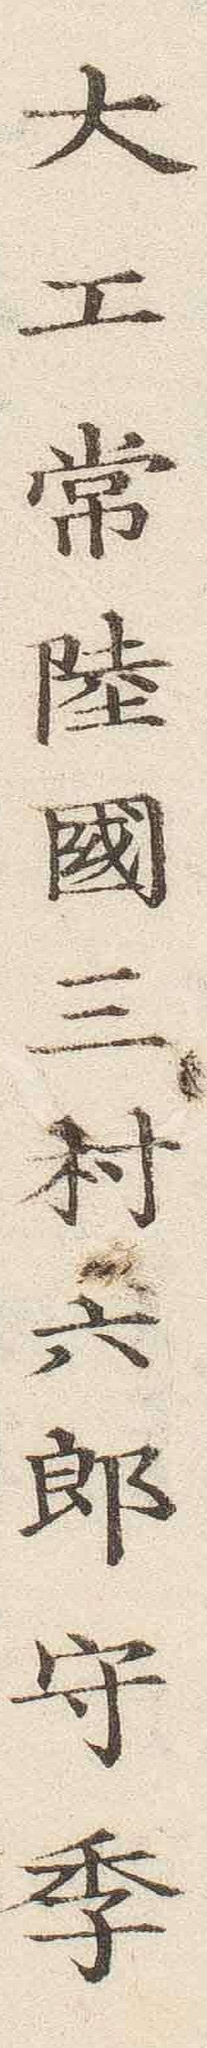大工常陸國三村六郎守季

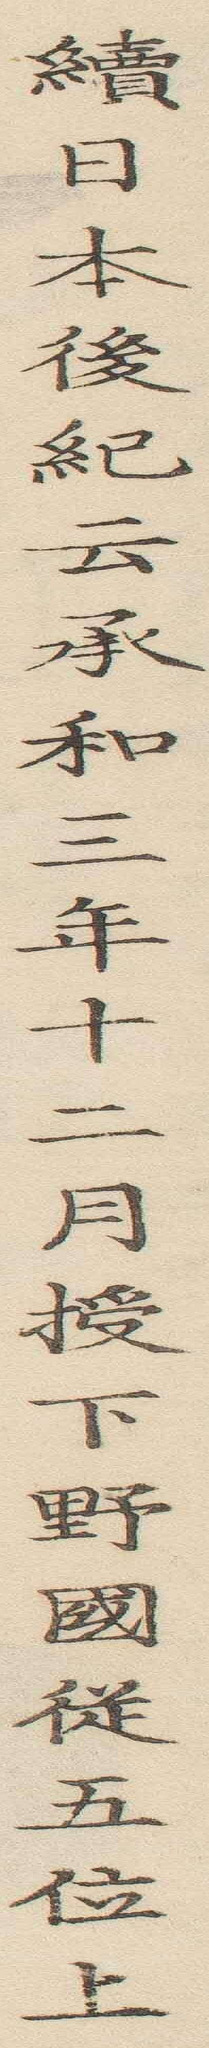續日本後紀云承和三年十二月授下野國従五位上
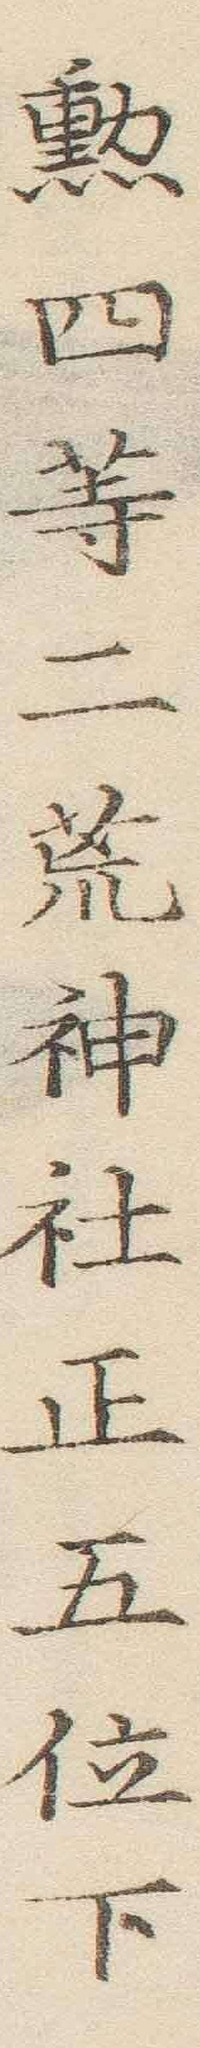勲四等二荒神社正五位下
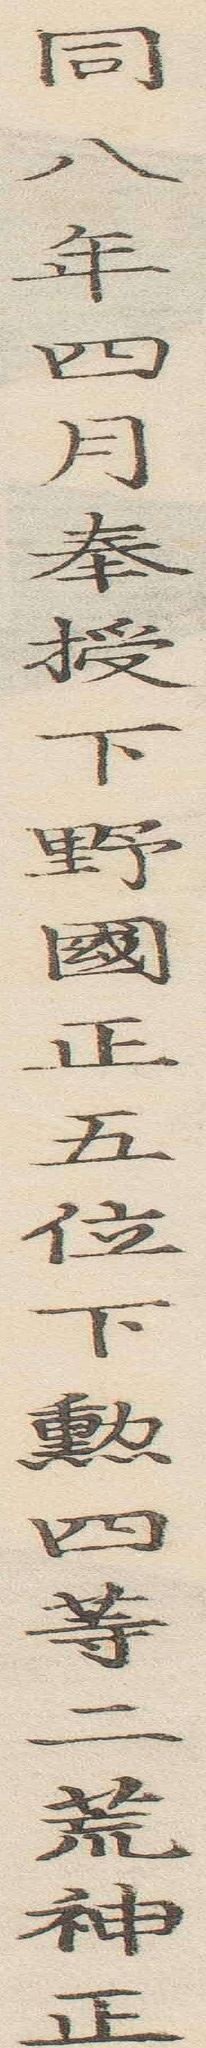同八年四月奉授下野國正五位下勲四等二荒神正
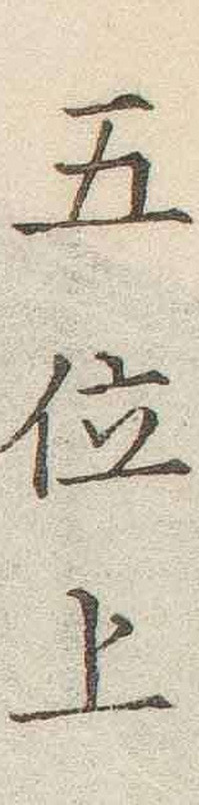五位上
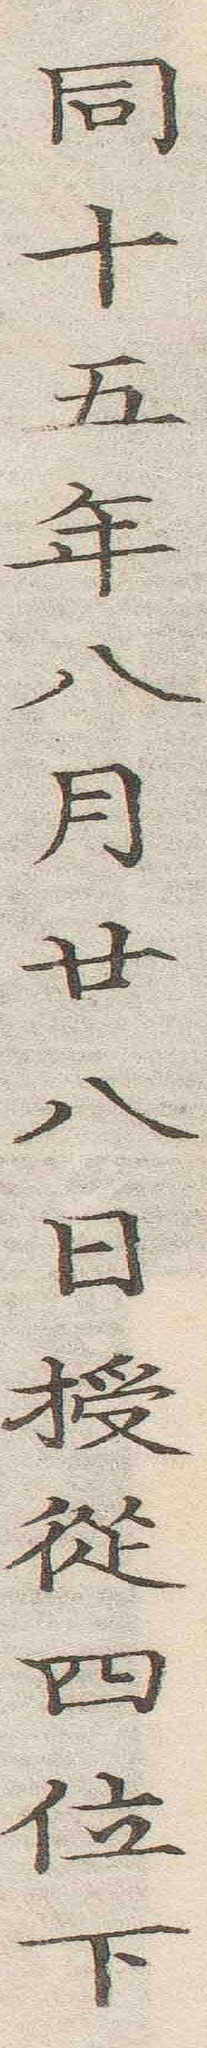同十五年八月廿八日授從四位下
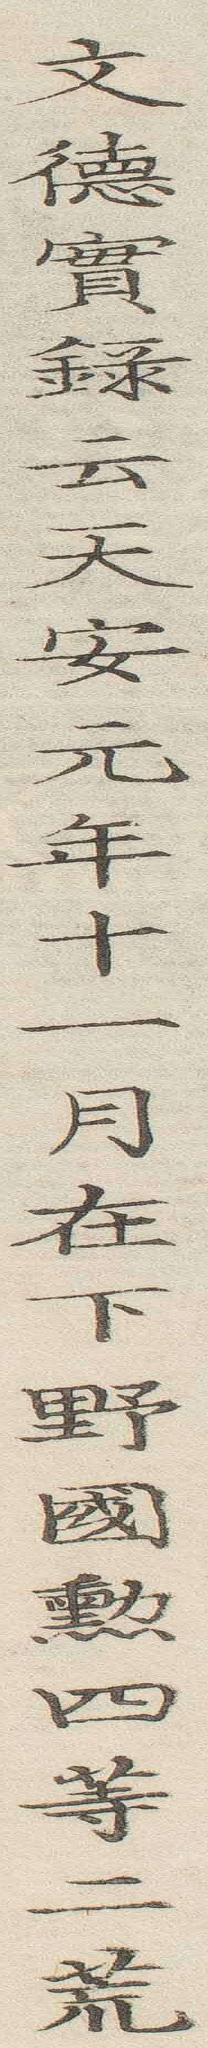文德實錄云天安元年十一月在下野國勲四等二荒
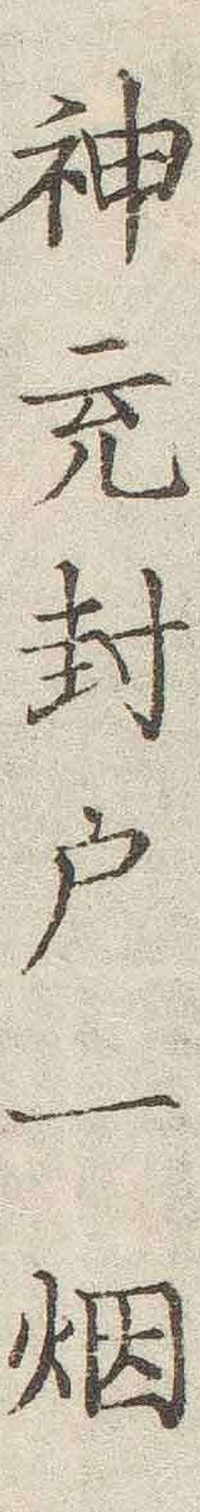神充封戸一烟
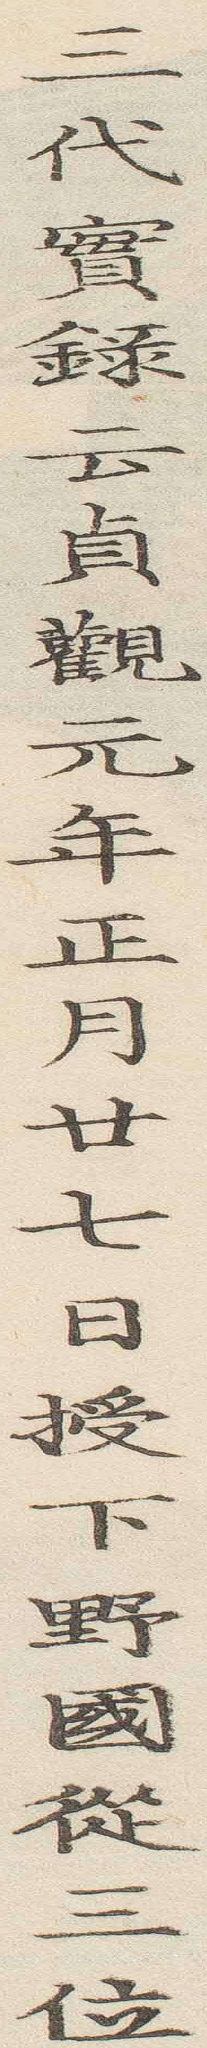三代實錄云貞觀元年正月廿七日授下野國從三位
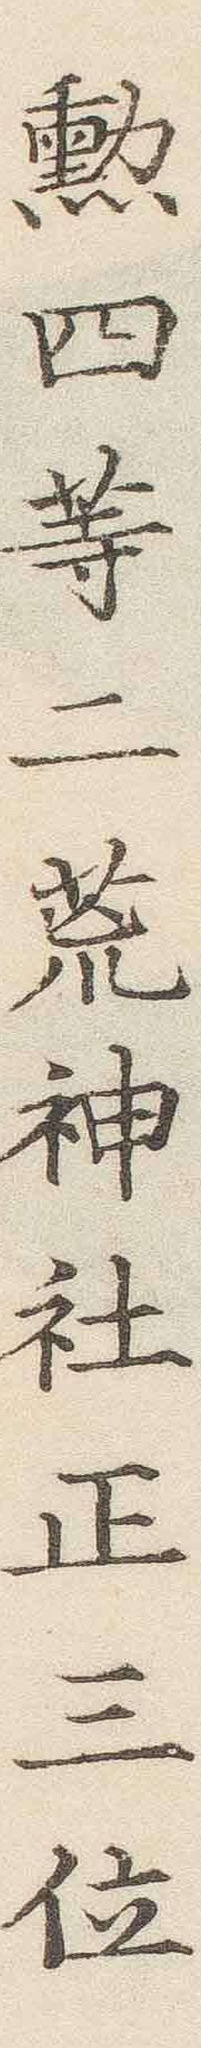勲四等二荒神社正三位
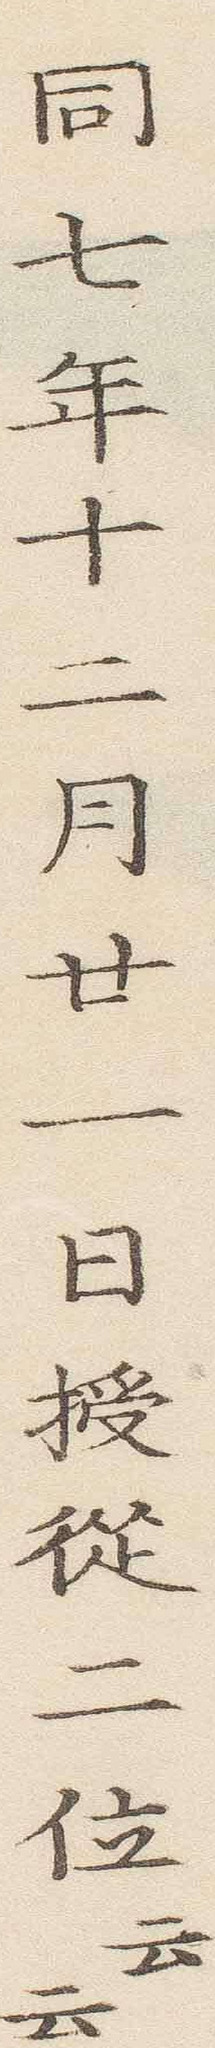同七年十二月廿一日授從二位云云
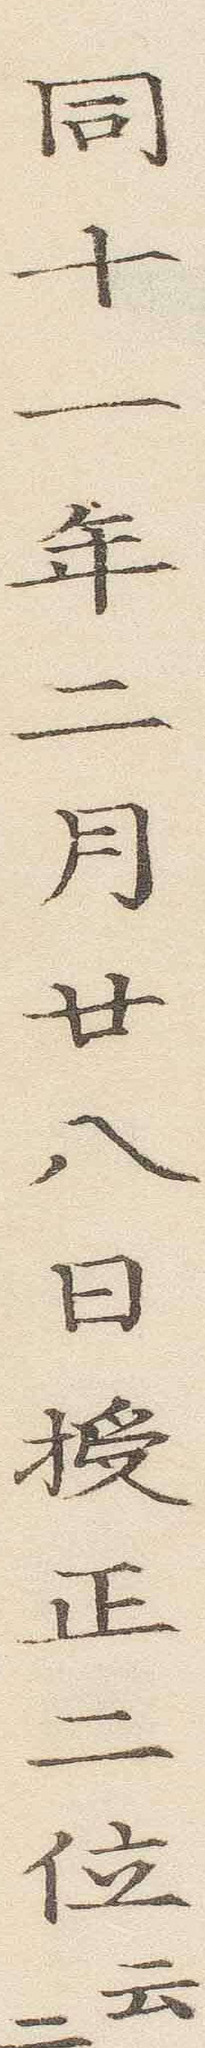同十一年二月廿八日授正二位云云
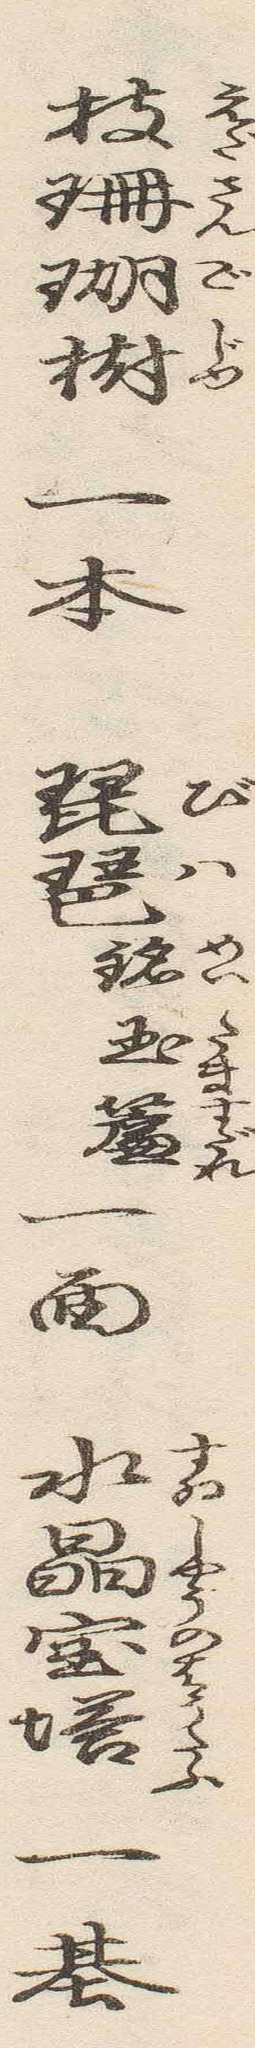枝珊瑚樹一本琵琶銘玉簾一面水晶宝塔一基
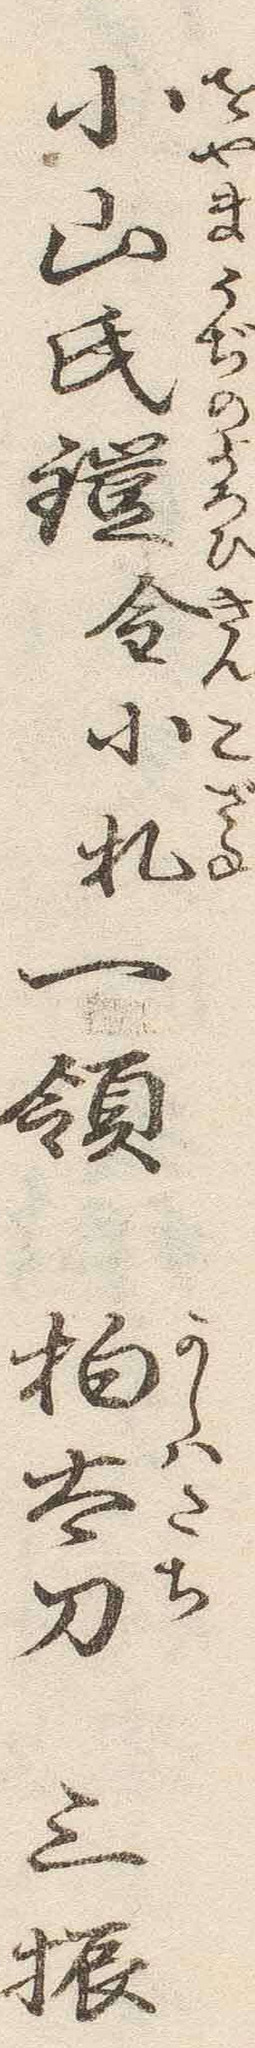小山氏鎧金小札一領柏太刀三振
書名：日光山志
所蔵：東京学芸大学附属図書館 国文学研究資料館
